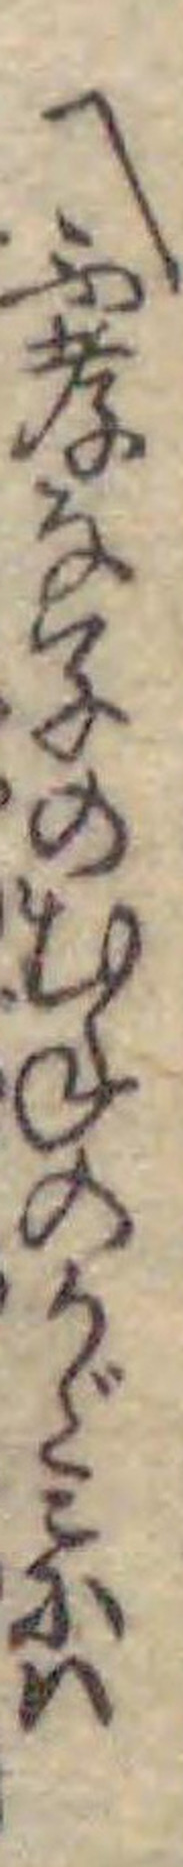〽不孝な子のむねのかゞみには
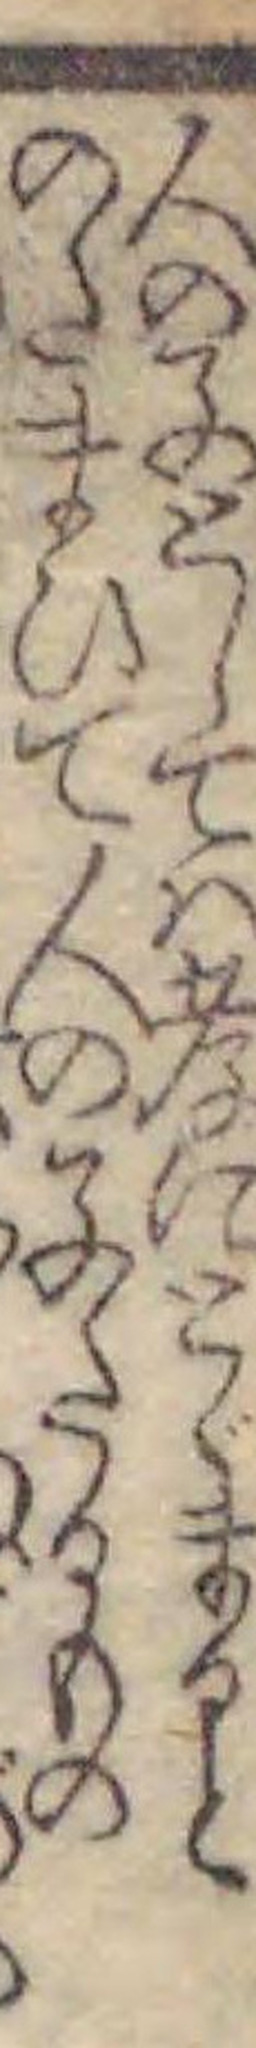のたまひて人の子たるもの
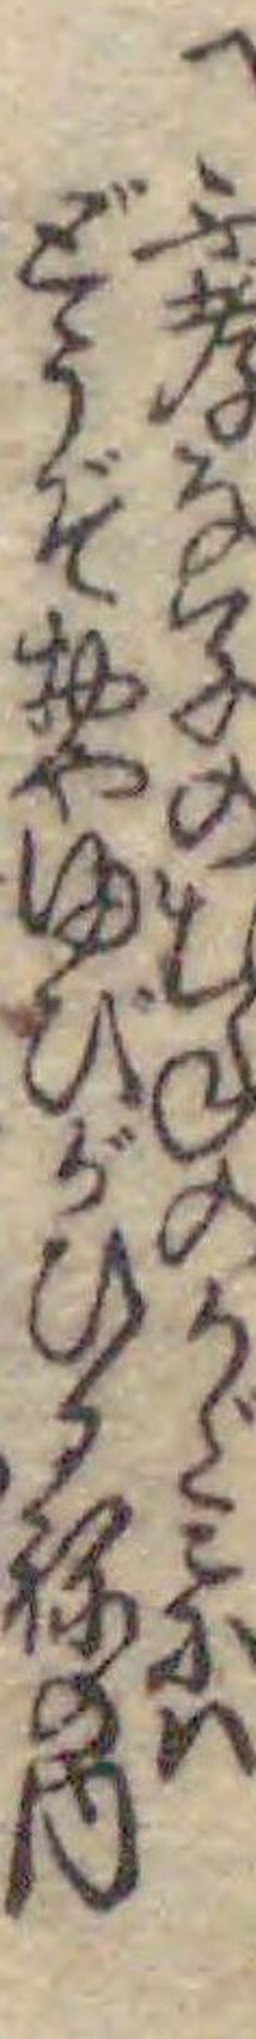どうぞおやゆびがひるねの内
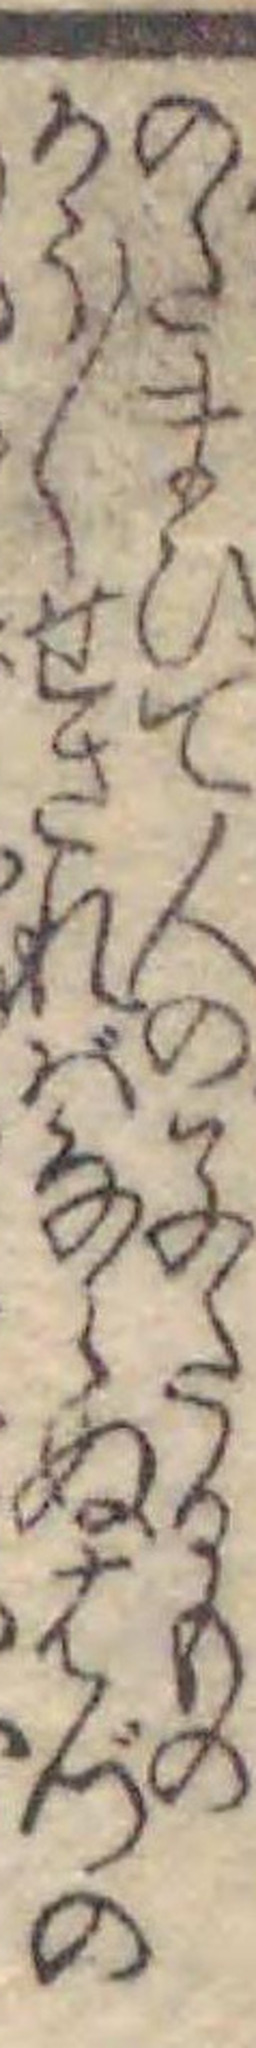かう〳〵せさればならぬはづの
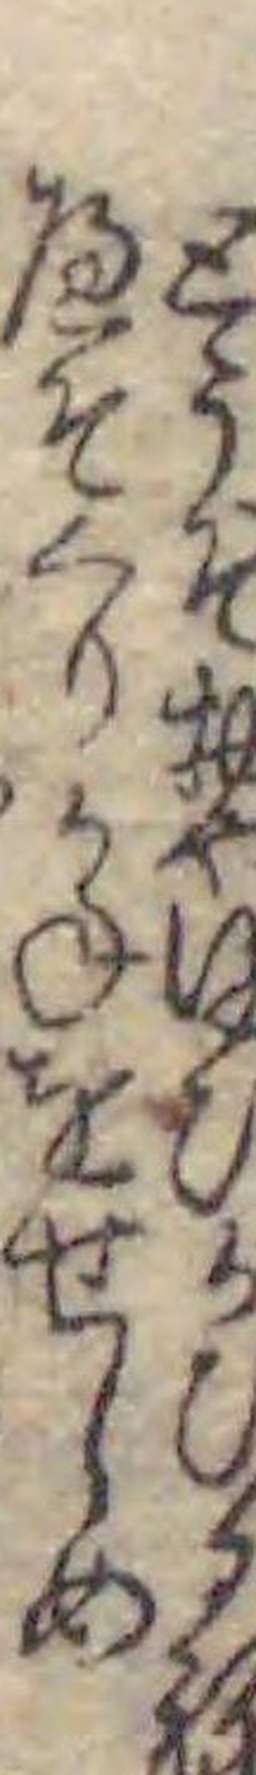へそくりかねをせしめ
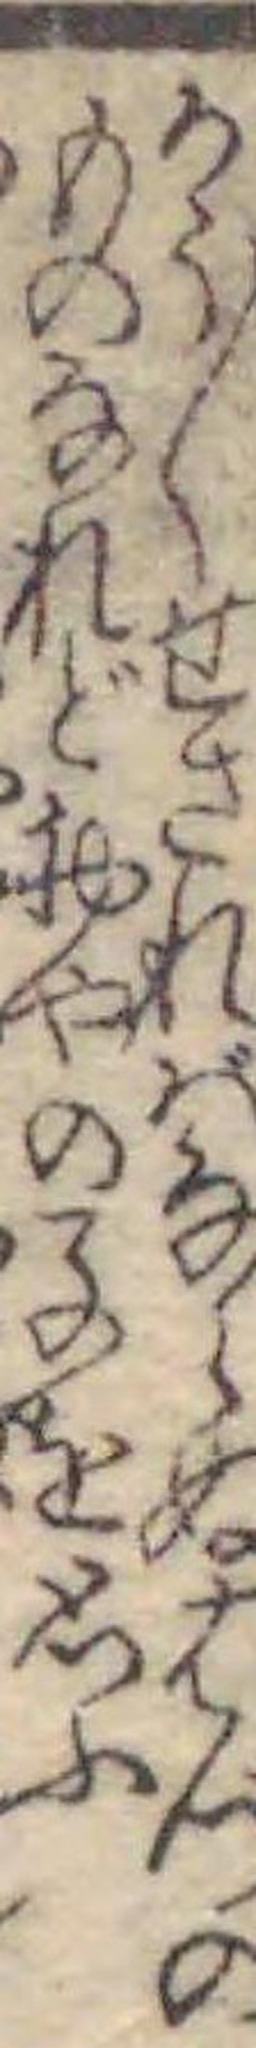ものなれどおやの子を思ふ
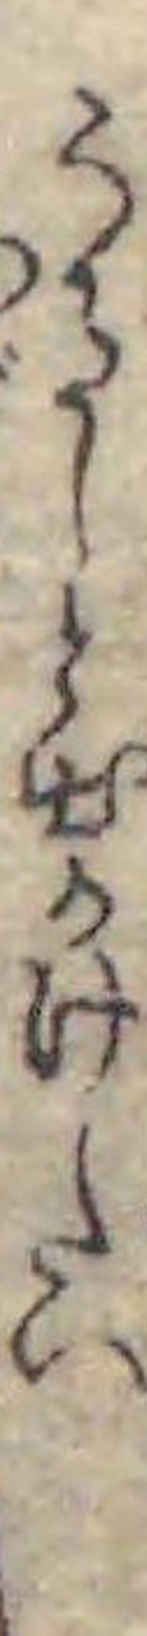うるしと出かけたい
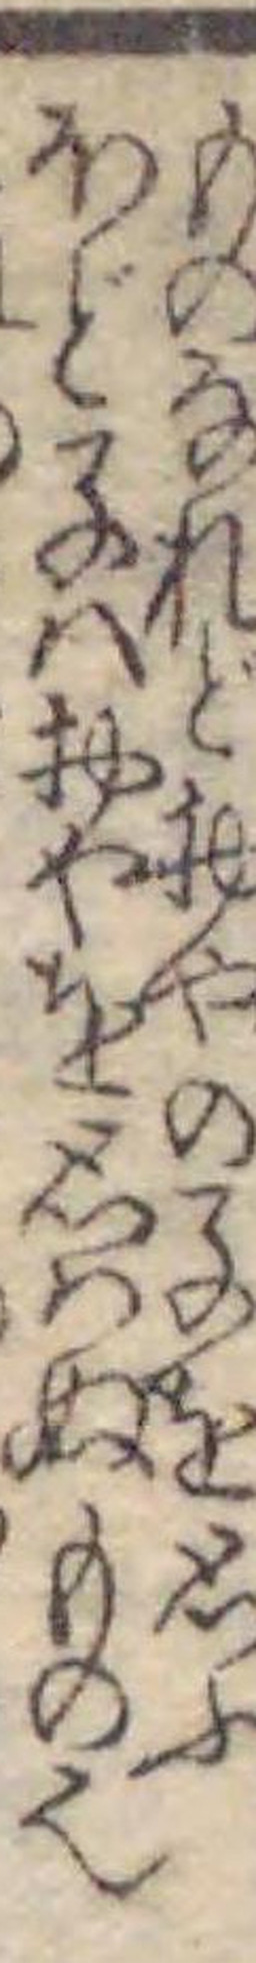ほど子はおやを思はぬもの也
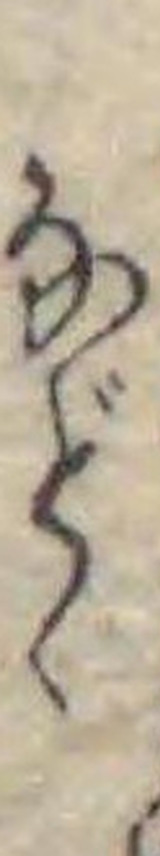などゝ
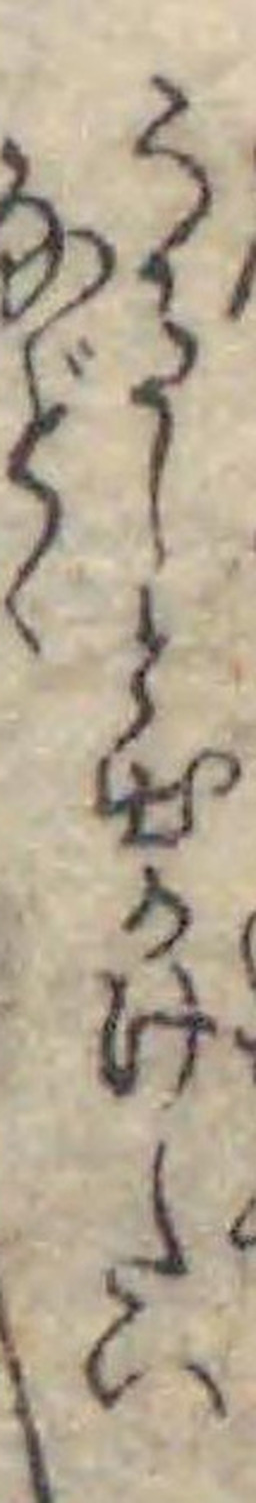などゝ
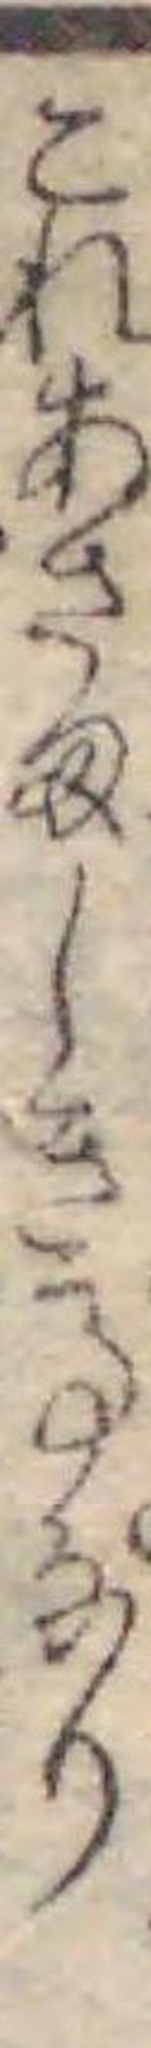これあさましき事なり
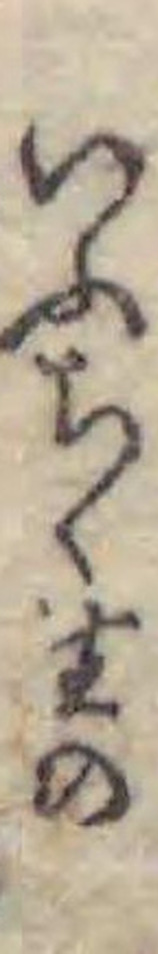いふちく生の
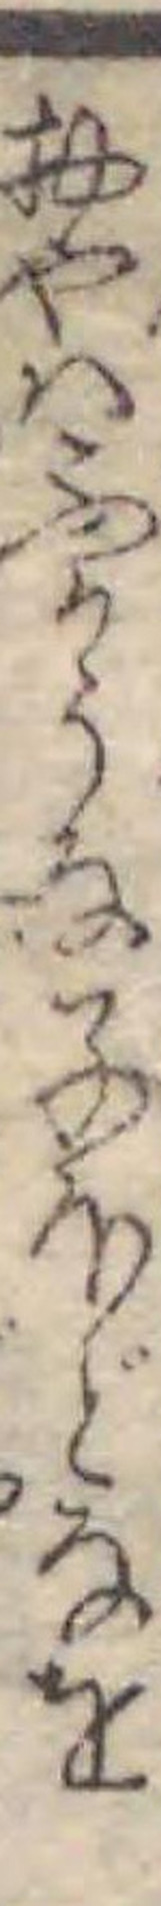おやはふかうな子ほどなを
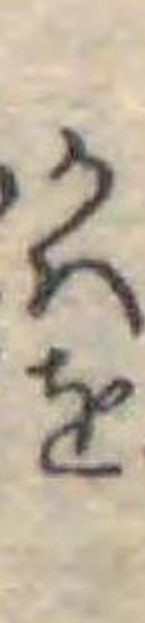かはを
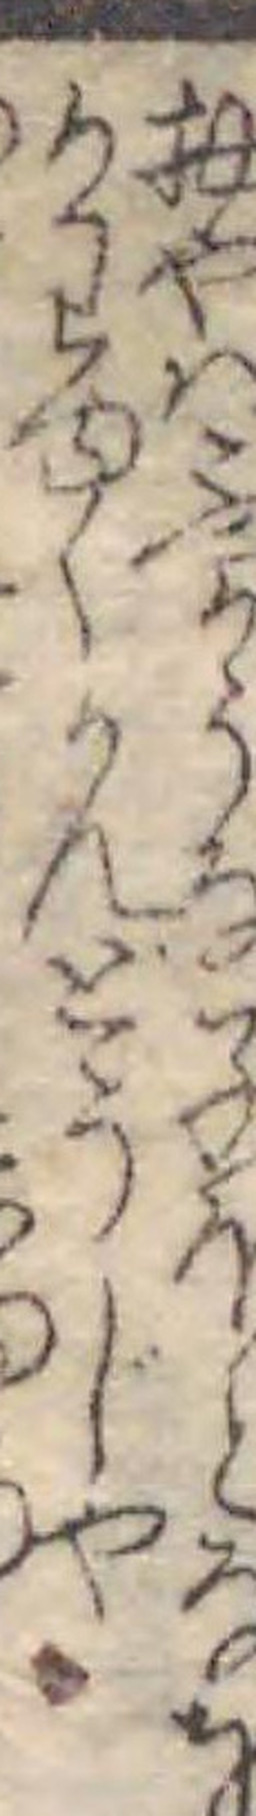かわゆくかんどうじや
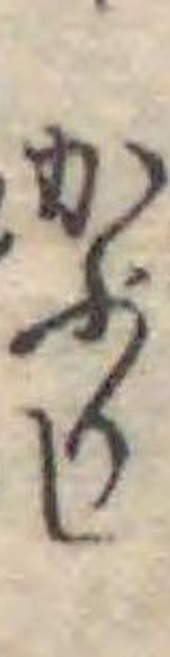かぶりし
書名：人心鏡写絵 : 3巻
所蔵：国立国会図書館 National Diet Library, JAPAN
